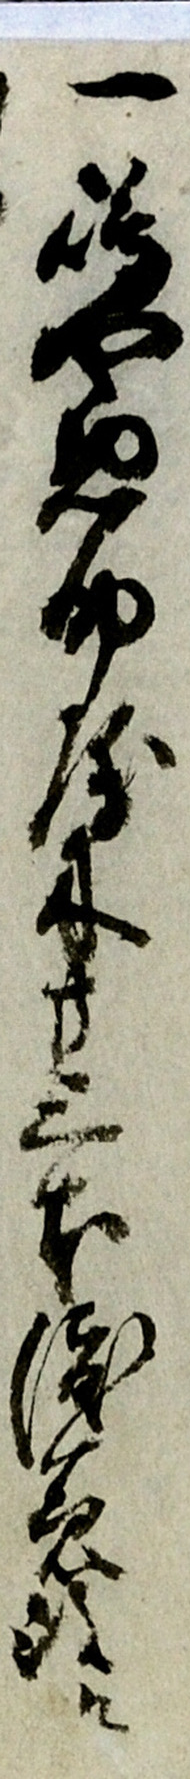一嶋や惣助屋木廿三本渡着改候
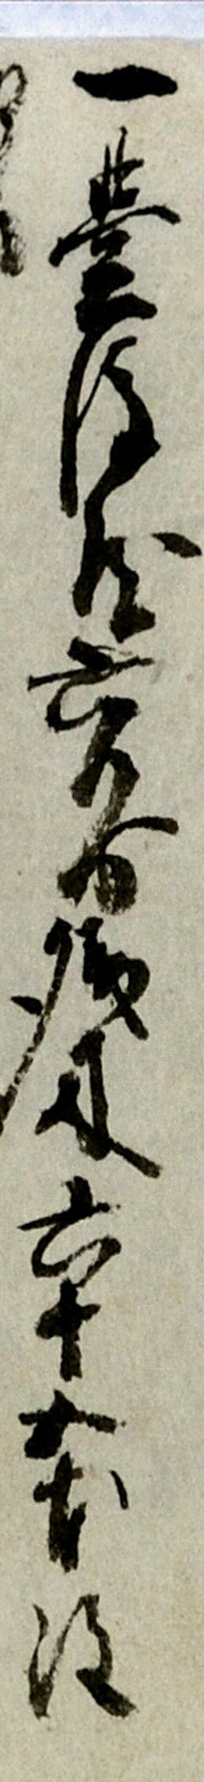一豊後屋六右衛門残木六十五本改
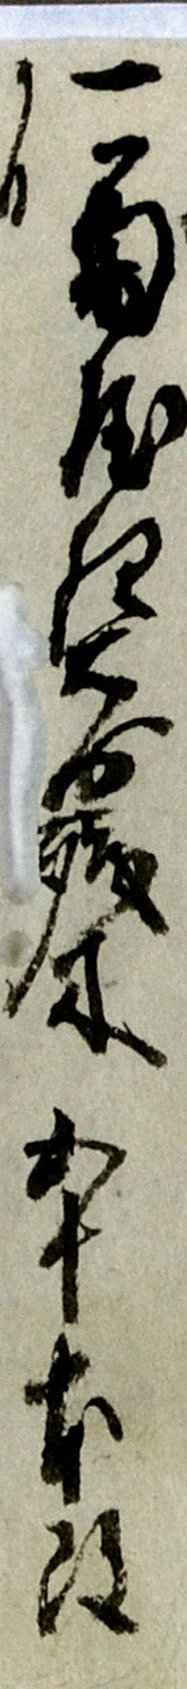一菊屋理右衛門残木五十本改
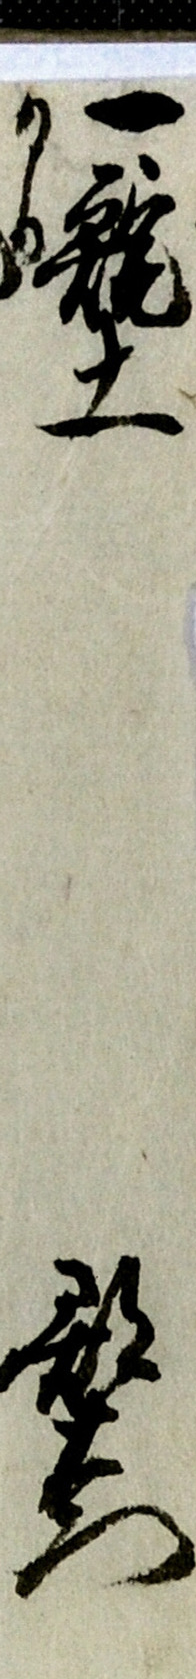一鯇十一郡右衛門
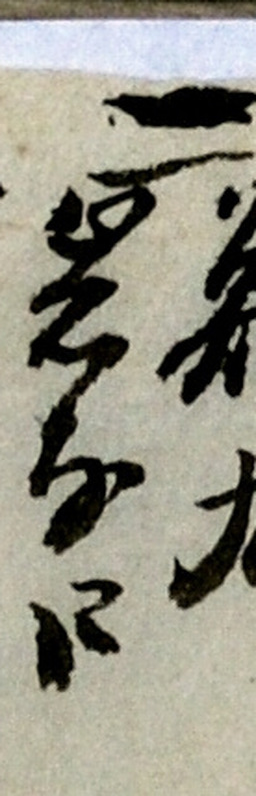岩な四
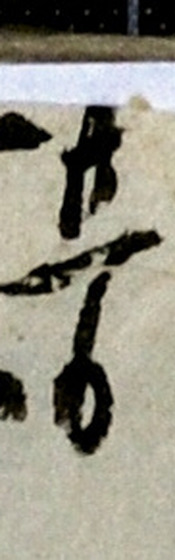廿一日
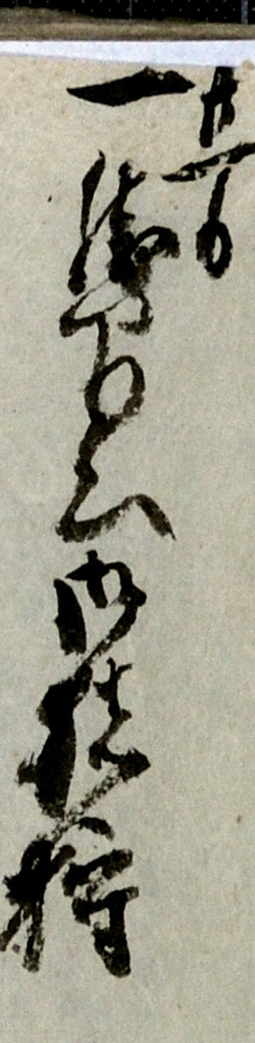一浅間山御猪狩

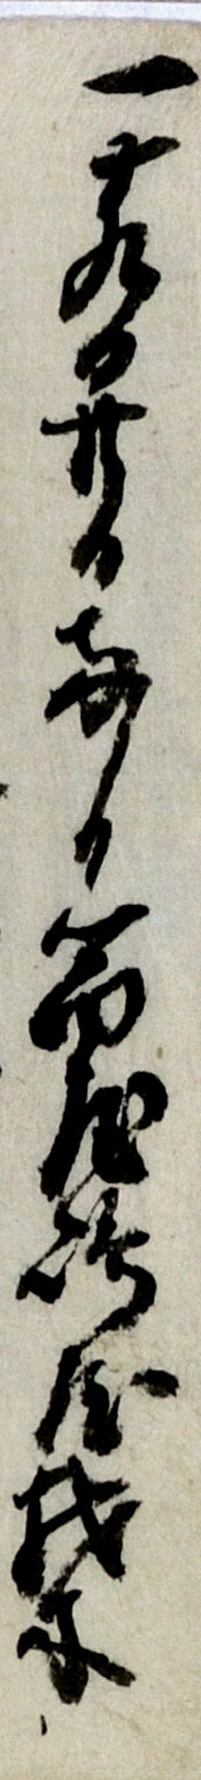一十九日廿日両日冨屋嶋屋材木
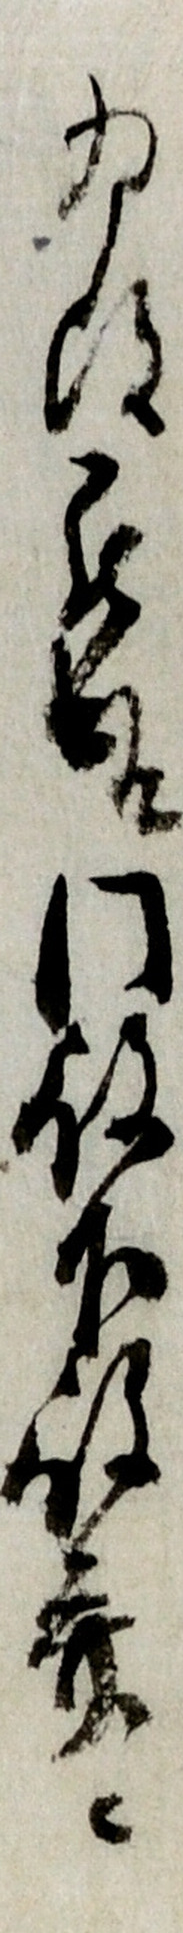為改罷出ル同役下役并ニ
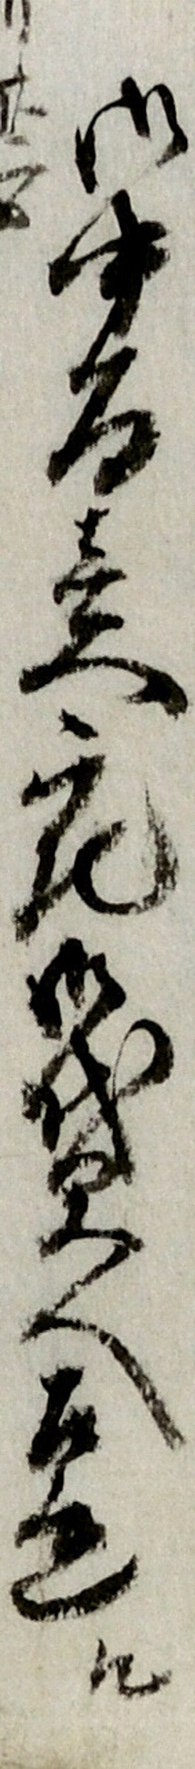御中間壱人宛御貸人召連ル
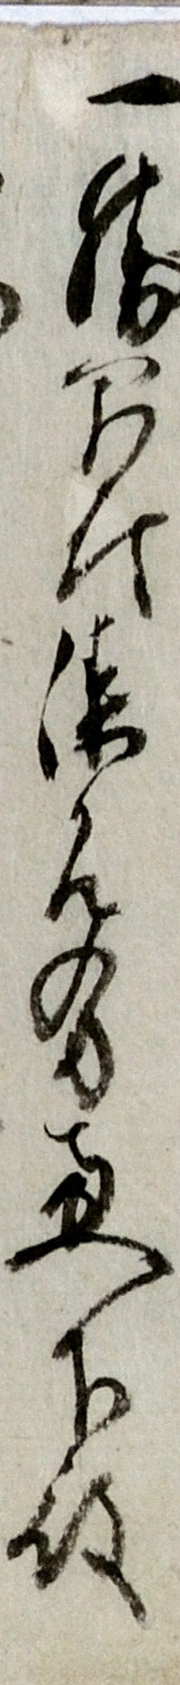一勝間村漆見分両人下役
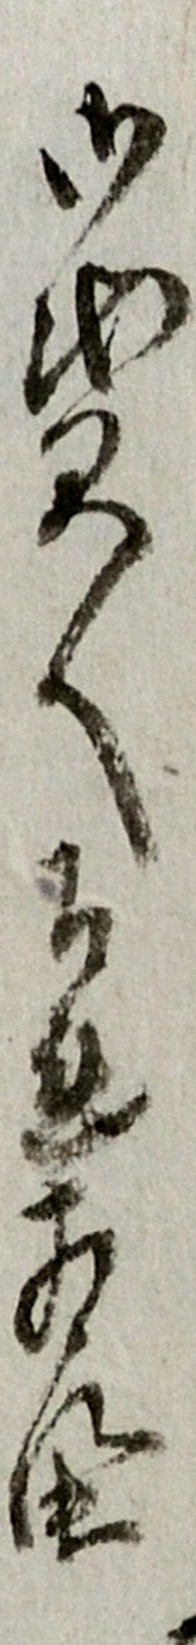御貸人召連相相済
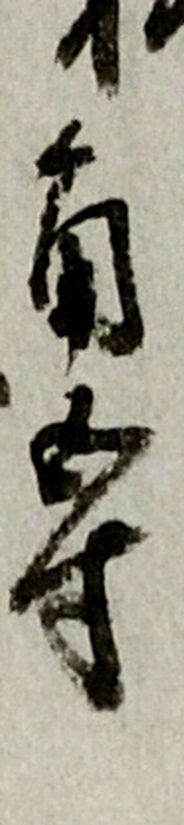角五寸
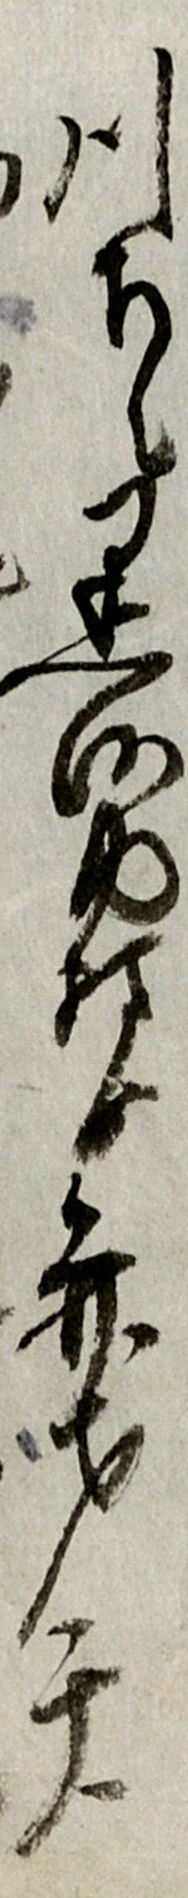川下候黒河内村ゟ弁才天
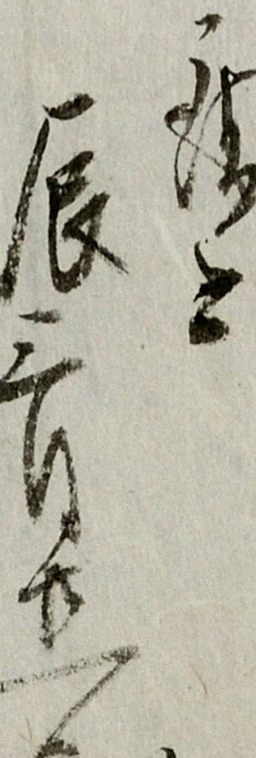辰三月廿一日
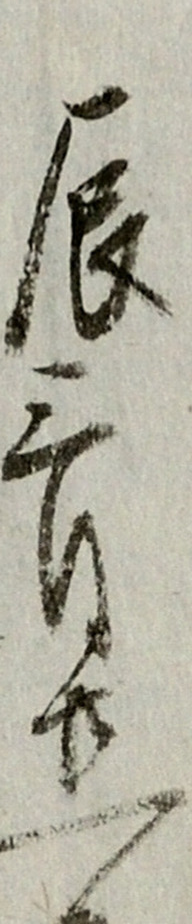辰三月廿一日
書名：分一方諸事御用留帳
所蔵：伊那市立高遠町図書館・合同会社AMANE
